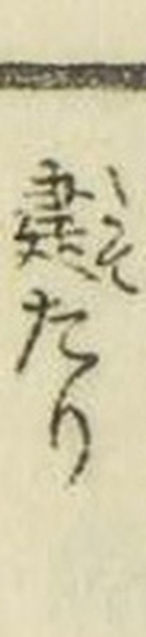建たり
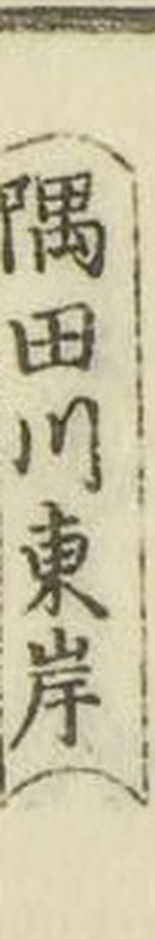隅田川東岸
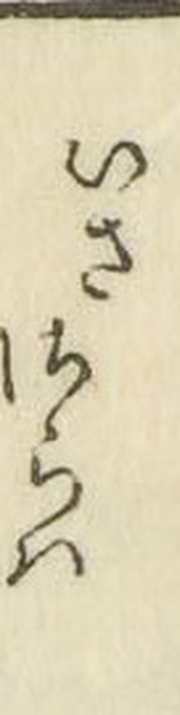いささらは
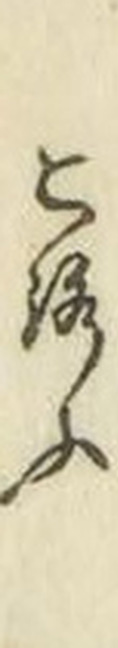ころふ
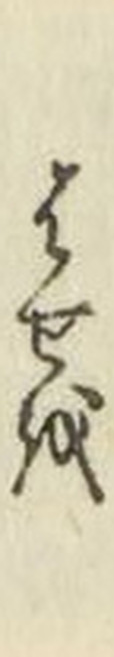はせを
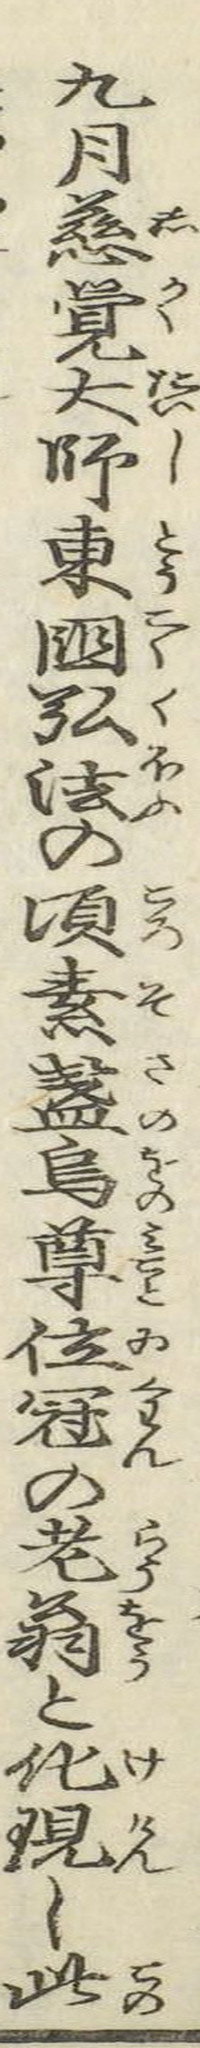九月慈覚大師東国弘法の頃素盞烏尊位冠の老翁と化現し此
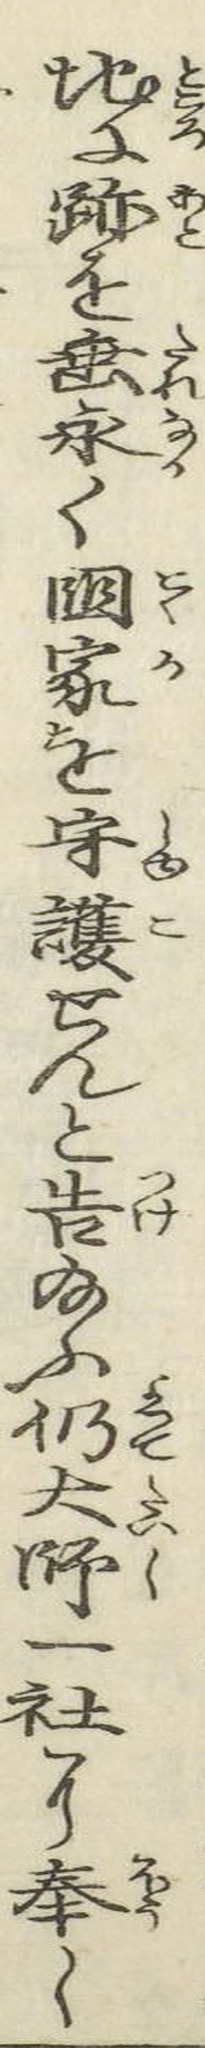地に跡を垂永く国家を守護せんと告給ふ仍大師一社に奉し
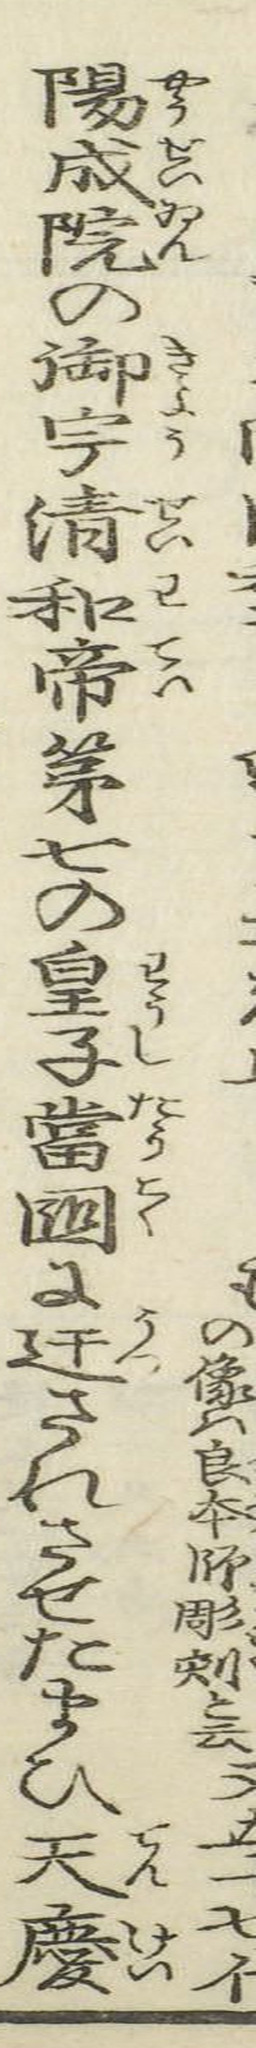陽成院の御宇清和帝第七の皇子当国に遷されさせたまひ天慶
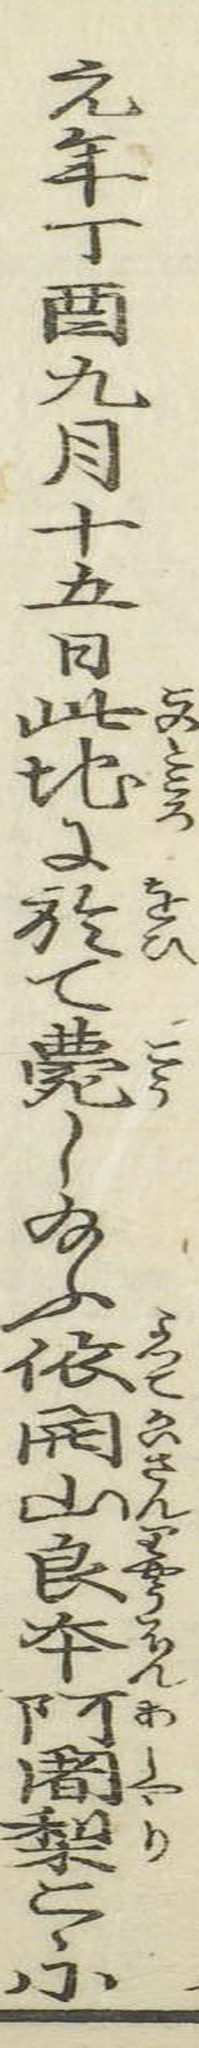元年丁酉九月十五日此地に於て薨し給ふ依開山良本阿闍梨こゝに

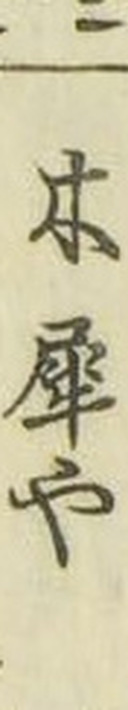木犀や
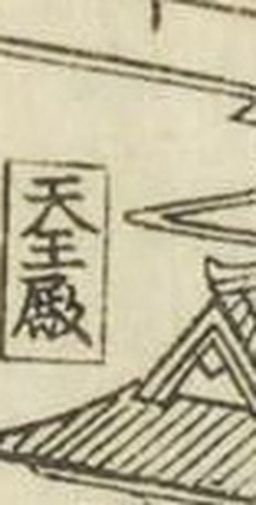天王殿
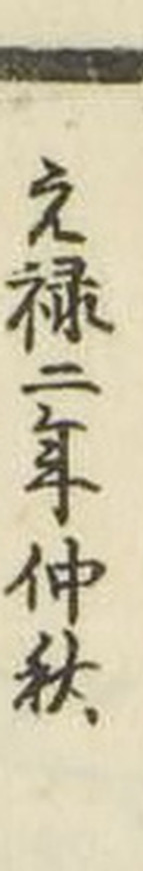元禄二年仲秋
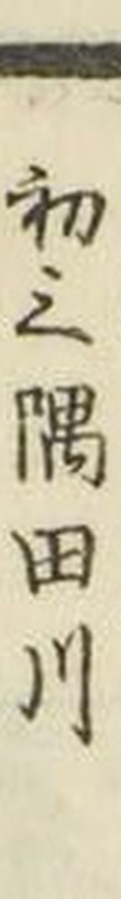初三隅田川
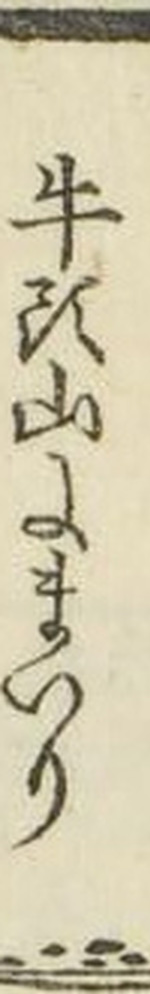牛頭山にまいり
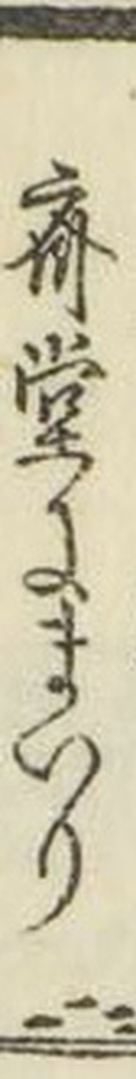斎堂にまいり
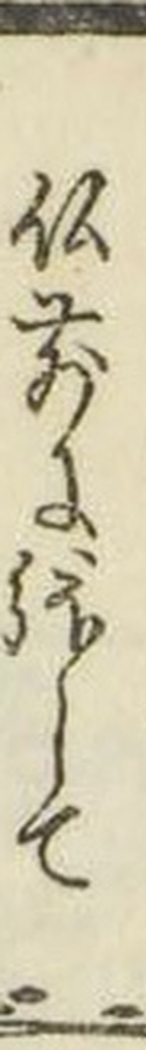仏前に拝して
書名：江戸名所図会 20巻 巻之19
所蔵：東京学芸大学教育コンテンツアーカイブ
